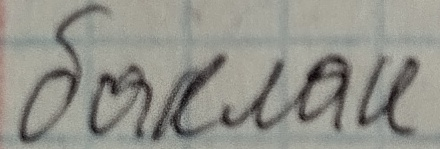баклан
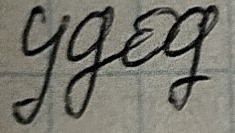удод
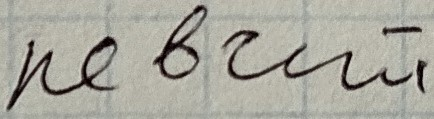певчий
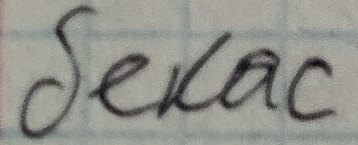бекас
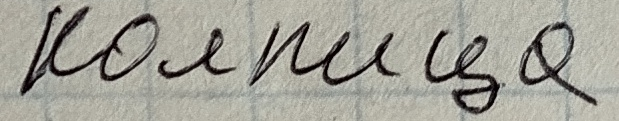колпица
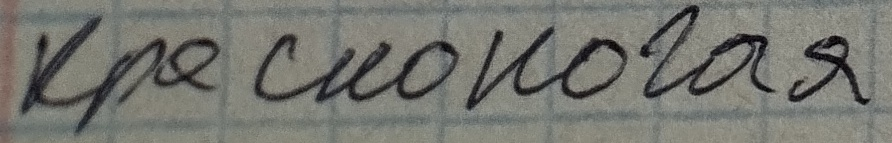красноногая
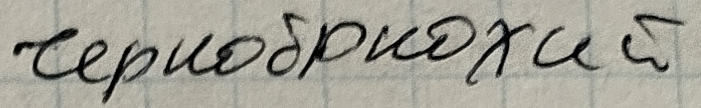чернобрнохий
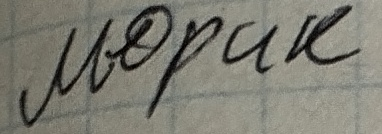люрик
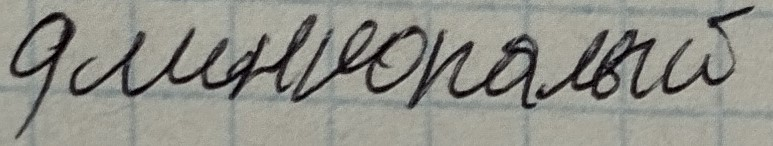длиннопалый
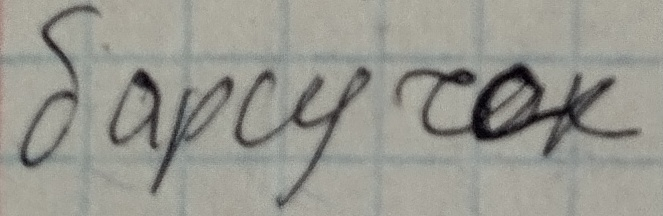барсучок
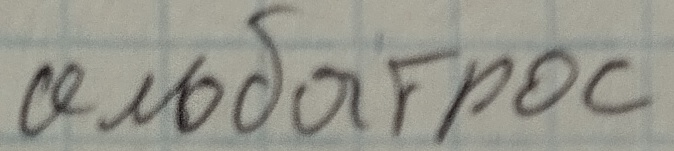альбатрос
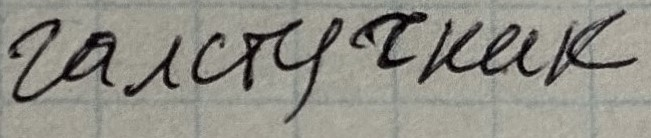галстучник
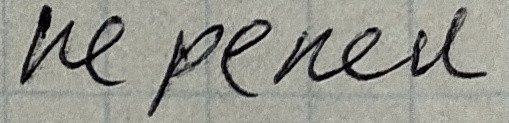перепел
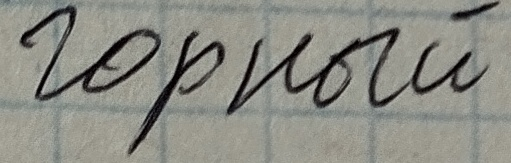горный
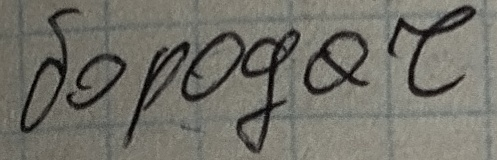бородач
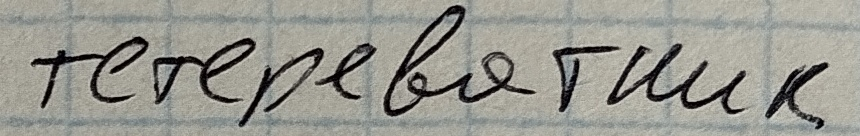тетеревятник
